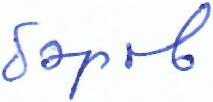бэров
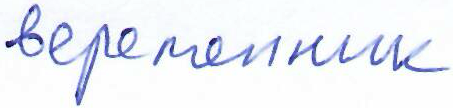веретенник
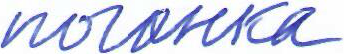поганка
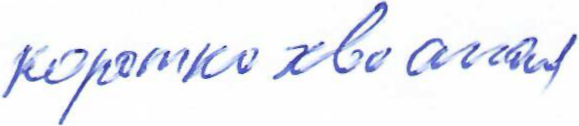короткохвостая
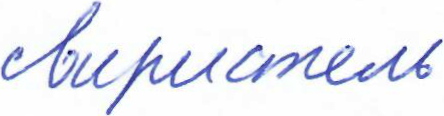свиристель
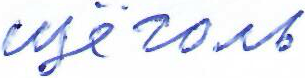щёголь
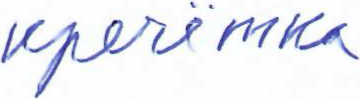кречётка
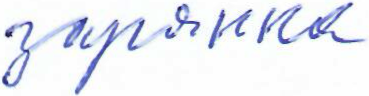зарянка
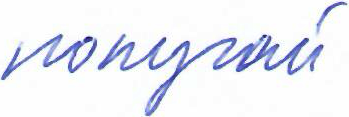попугай
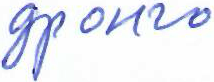дронго
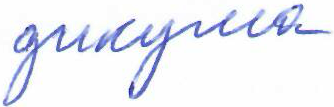дикуша
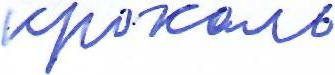крохаль
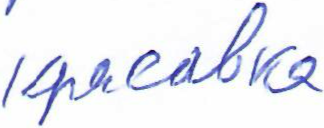красавка
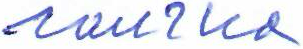гаичка
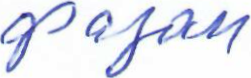фазан
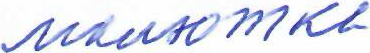малютка
